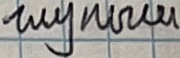глупыш
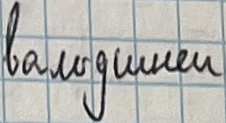вальдшнеп
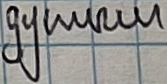дутыш
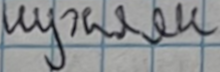пухляк
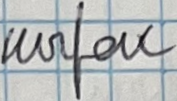нырок
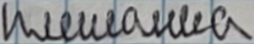плешанка
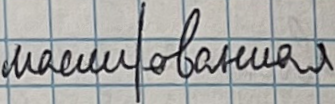маскированная
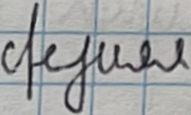средняя
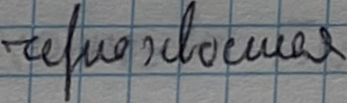чернохвостая
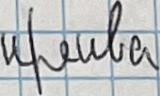кряква
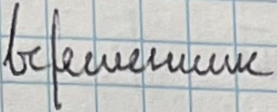веретенник
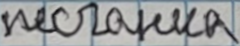песчанка
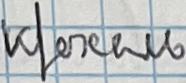крохаль
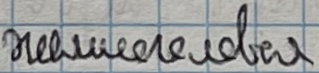желтоголовая
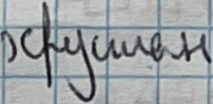хрустан
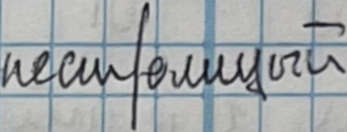пестролицый
